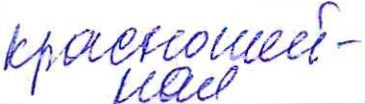красношей-ная
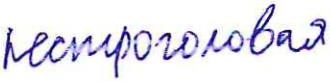пестроголовая
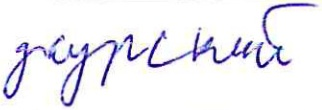даурский
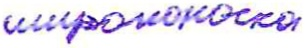широконоска
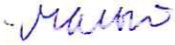малый
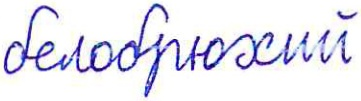белобрюхий
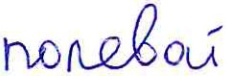полевой
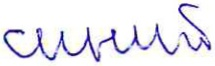синий
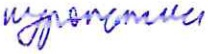куропатки
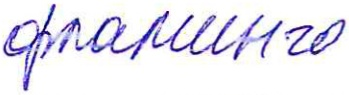фламинго
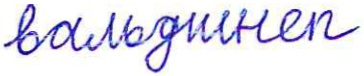вальдшнеп
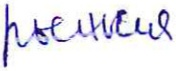рыжая
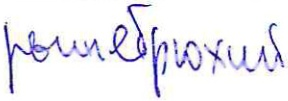рыжебрюхий
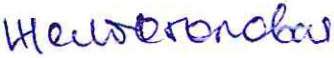желтоголовая
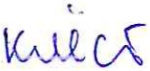клёст
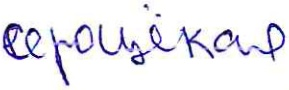сероцёкая
